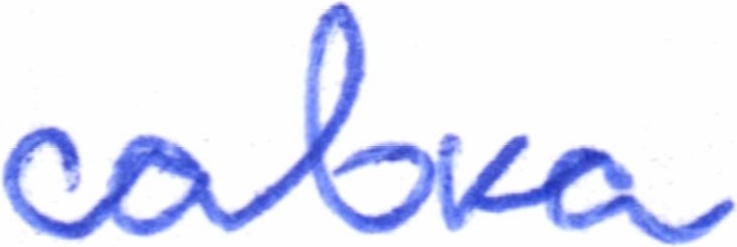савка
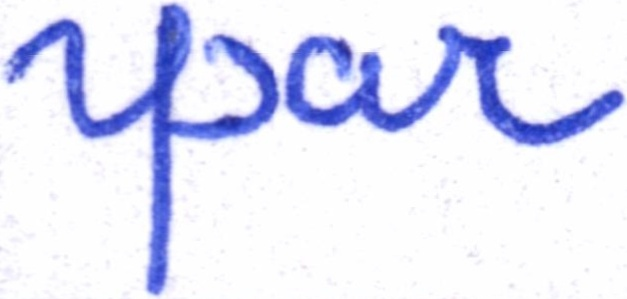грач
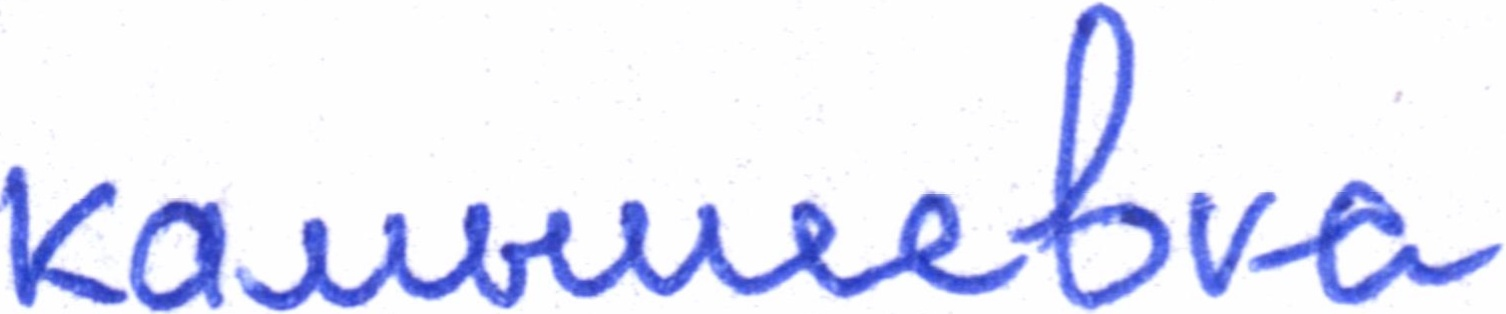камышевка
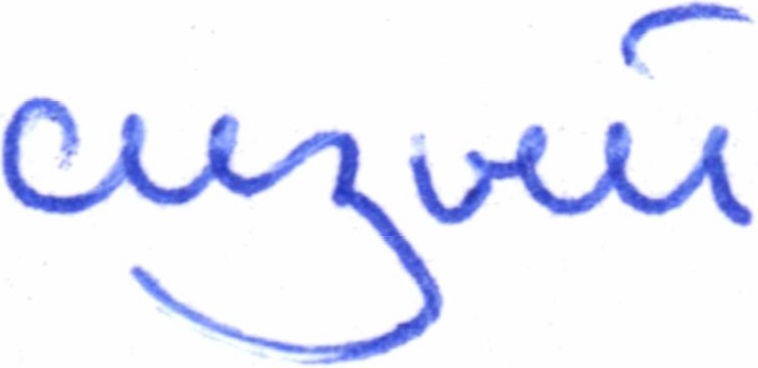сизый
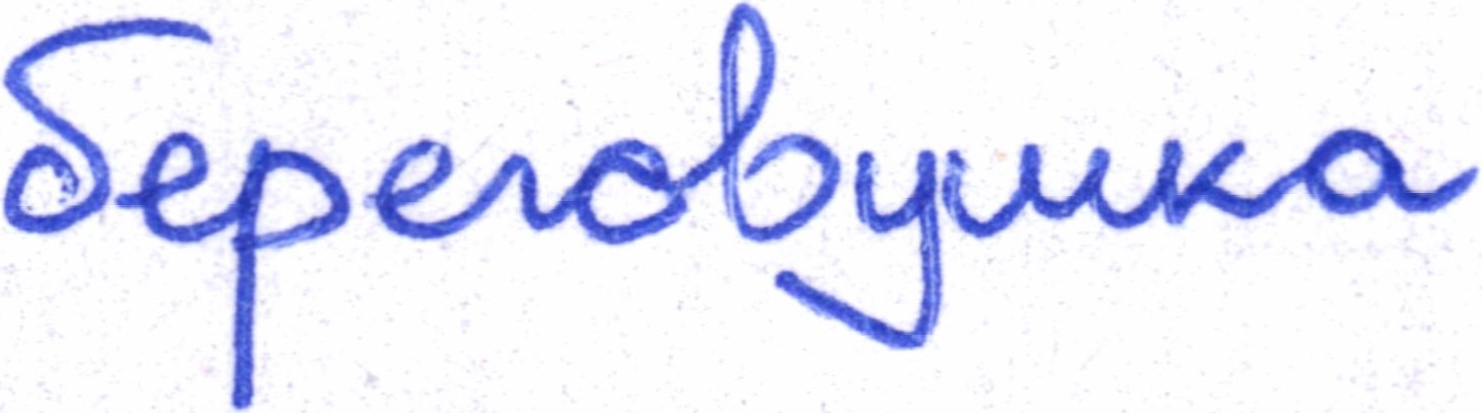береговушка
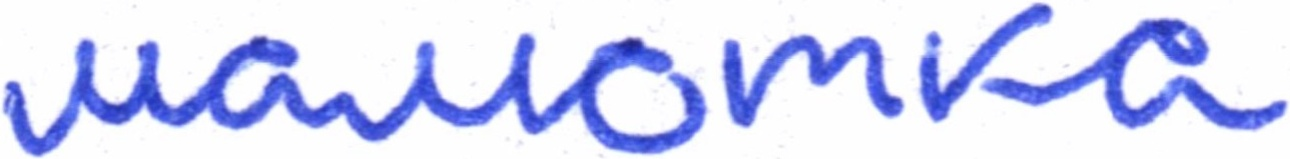малютка
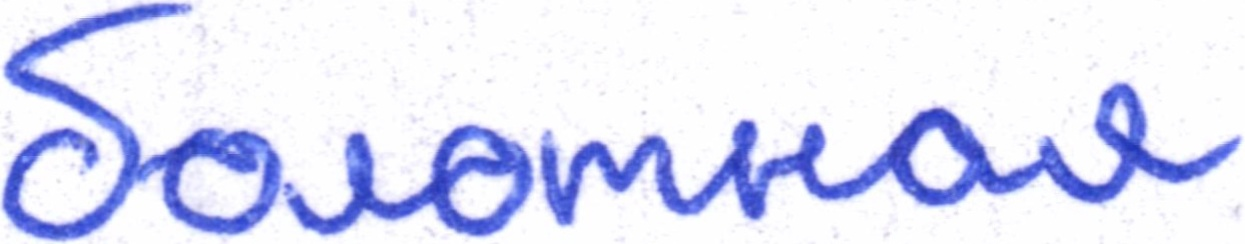болотная
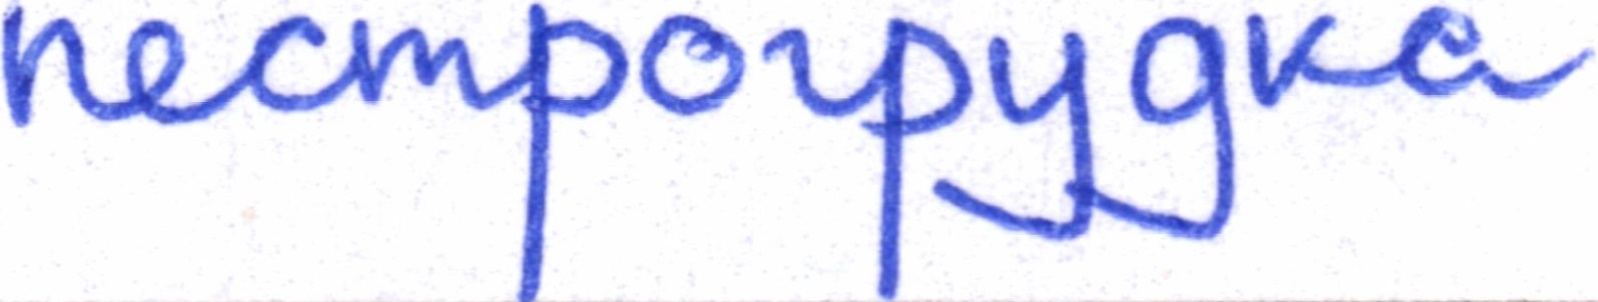пестрогрудка
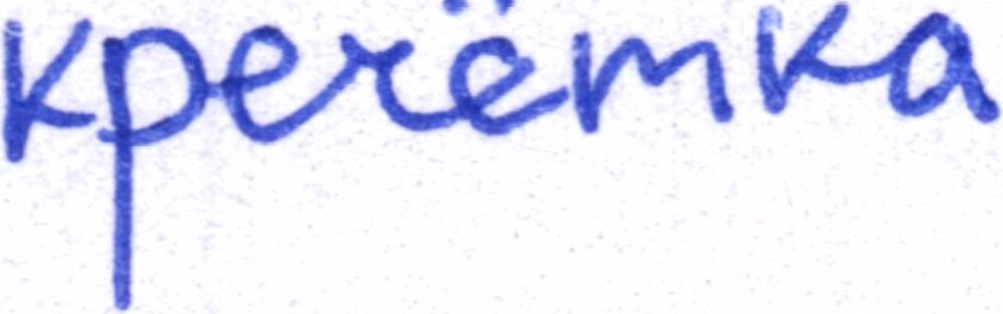кречётка
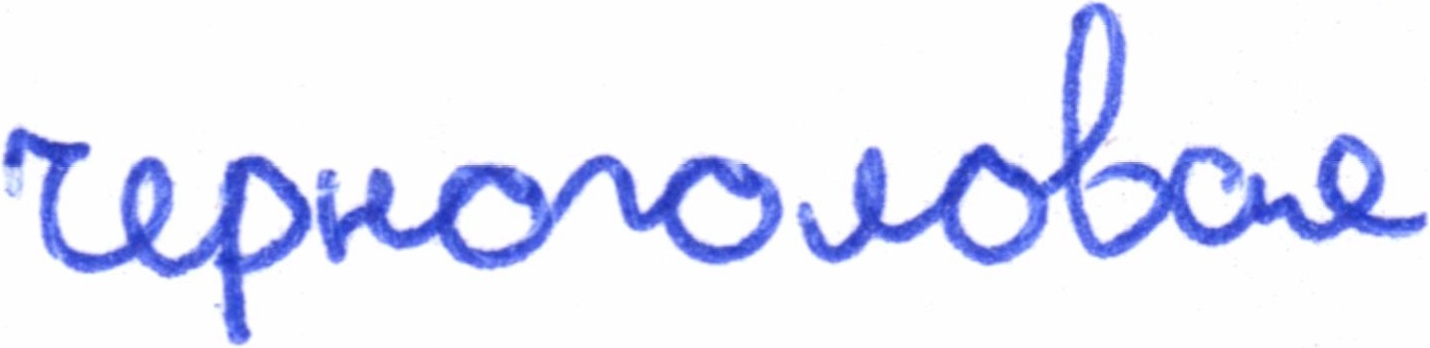черноголовая
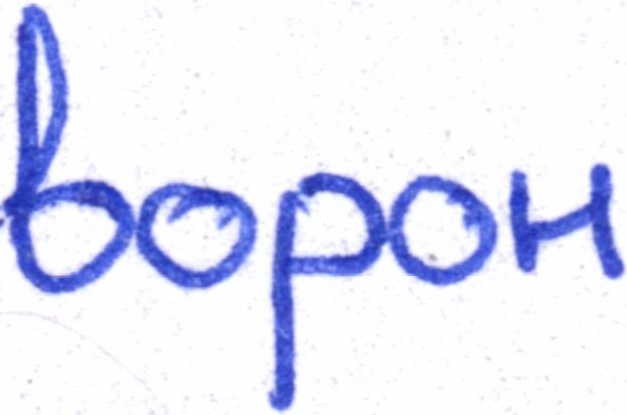ворон
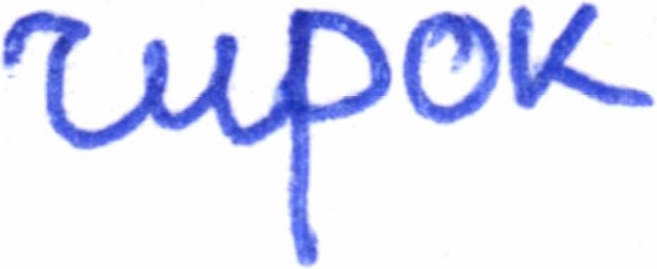чирок
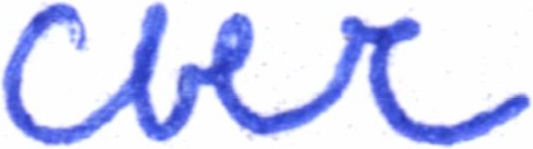сыч
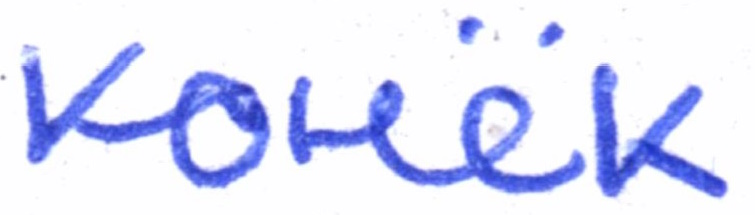конёк
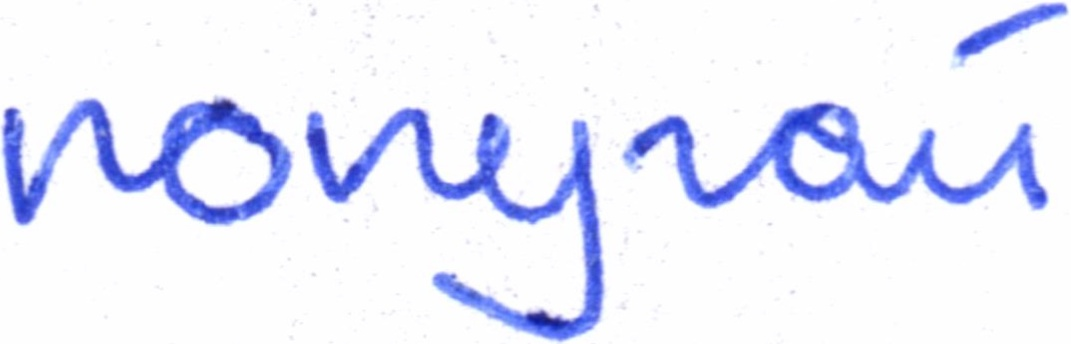попугай
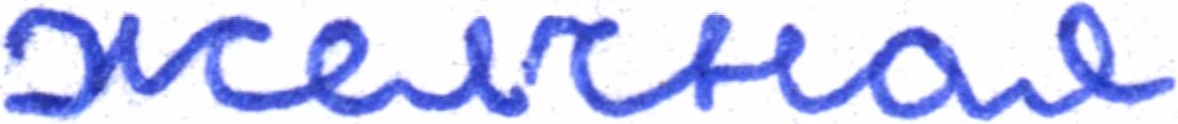желчная
